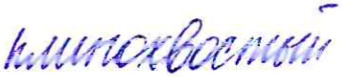клинохвостый
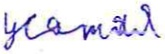усатая
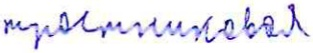тростниковая
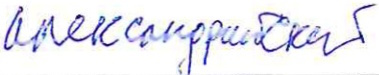александрийский
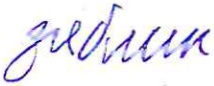зяблик
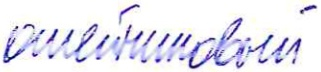ошейниковый
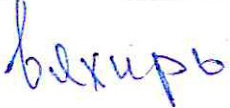вяхирь
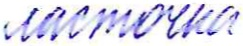ласточка
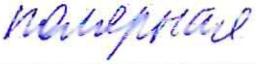полярная
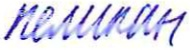пеликан
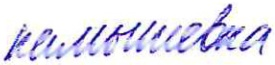камышевка
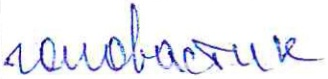головастик
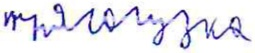трясогузка
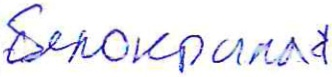белокрылая
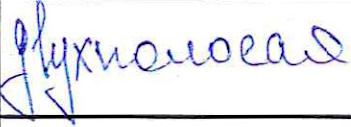двухполосая
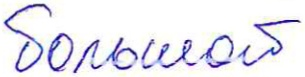большой
